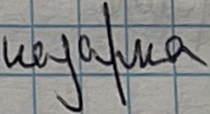казарка
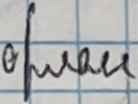орлан
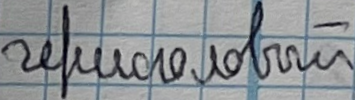черноголовый
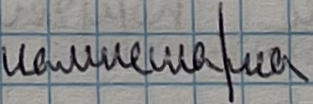камнешарка
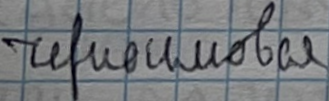черноклювая
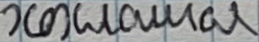хохлатая
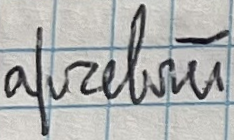арчевый
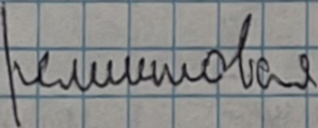реликтовая
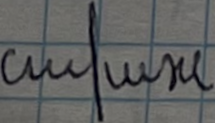стриж
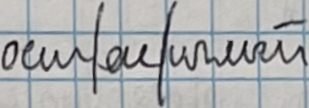острокрылый
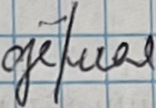озёрная
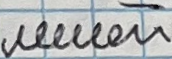лесной
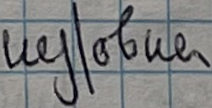кедровка
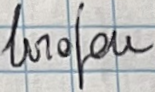вьюрок
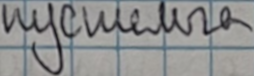пустельга
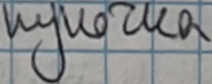пуночка
